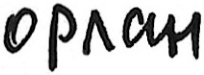орлан
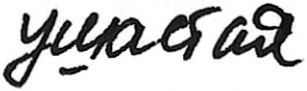ушастая
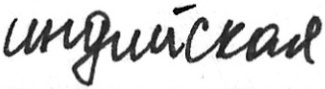индийская
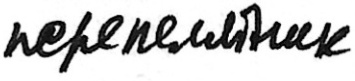перепелятник
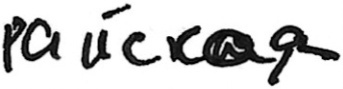райская
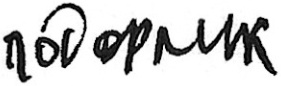подорлик
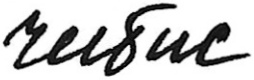чибис
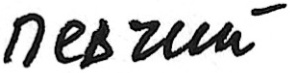певчий
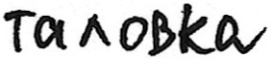таловка
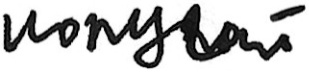попугай
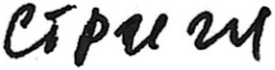стриж
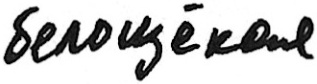белощёкая
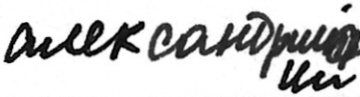александрийски
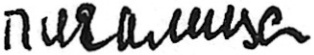пигалица
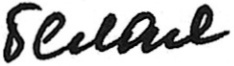белая
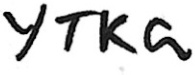утка
